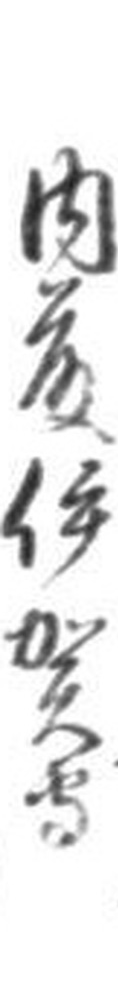内藤伊賀守
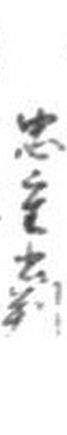忠重書判
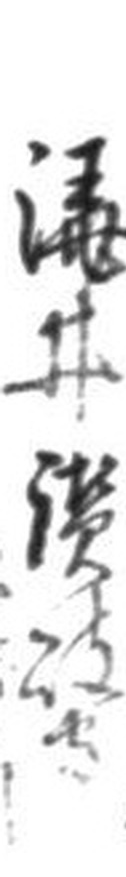酒井讃岐守
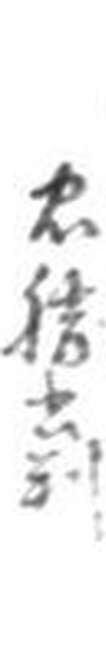忠勝書判

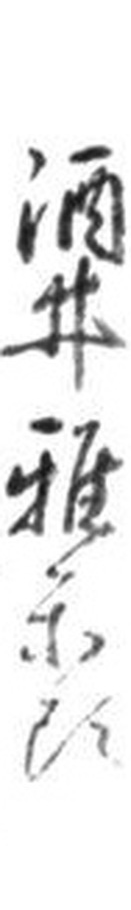酒井雅楽頭
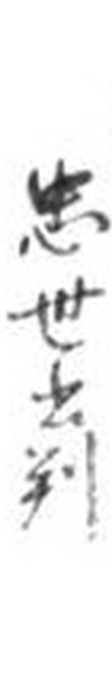忠世書判
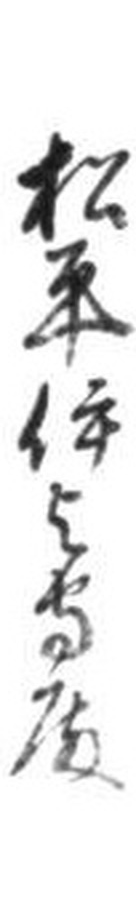松平伊与守殿
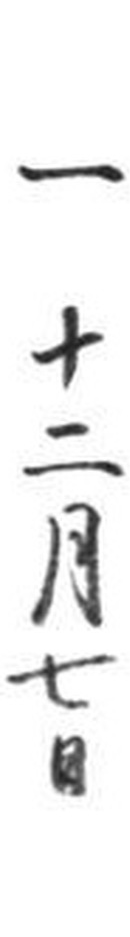一十二月七日
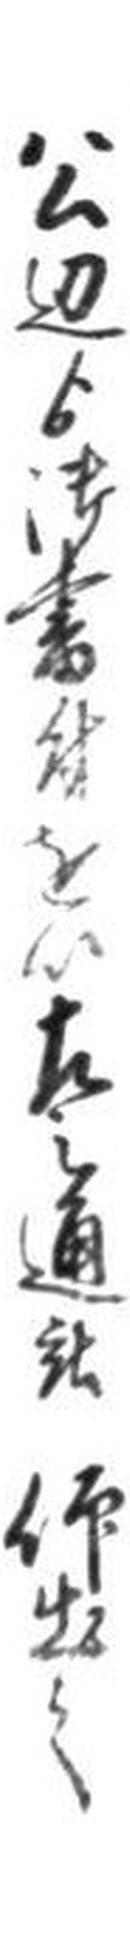公辺ゟ御書付を以左之通被仰出之
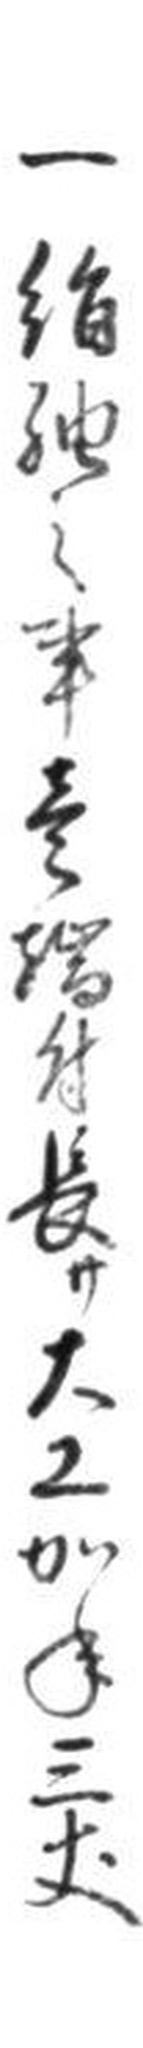一絹紬之事壱端付長サ大工かね三丈
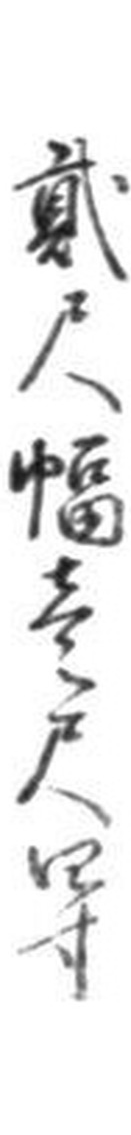弐尺幅壱尺四寸
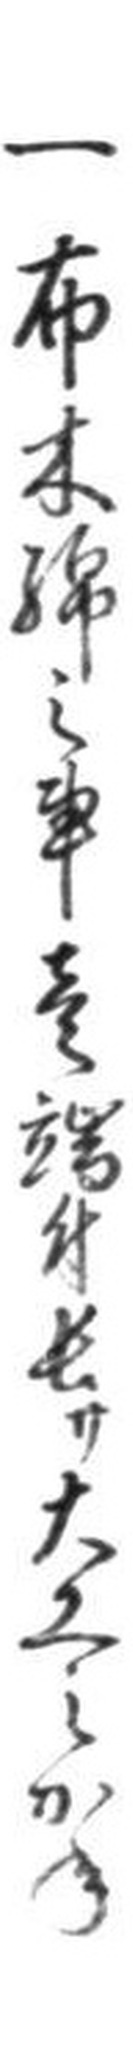一布木綿之事壱端付長サ大工之かね
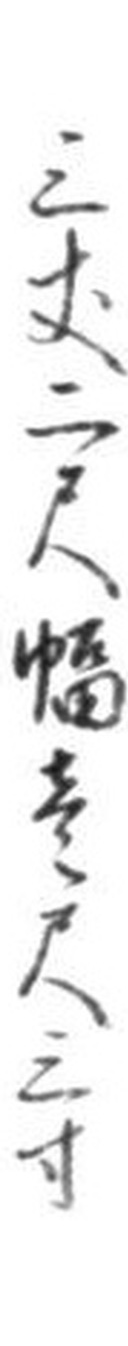三丈二尺幅壱尺三寸
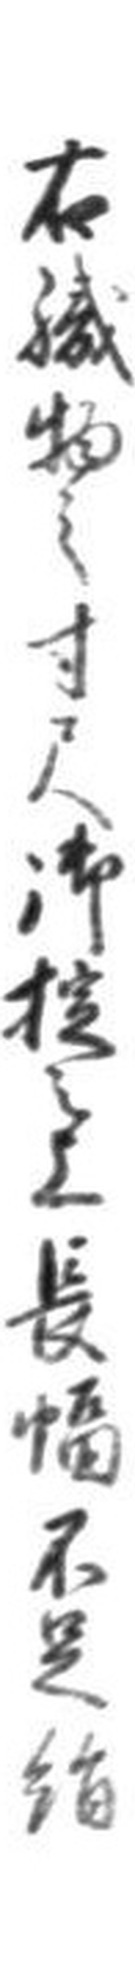右織物之寸尺御掟之上長幅不足絹
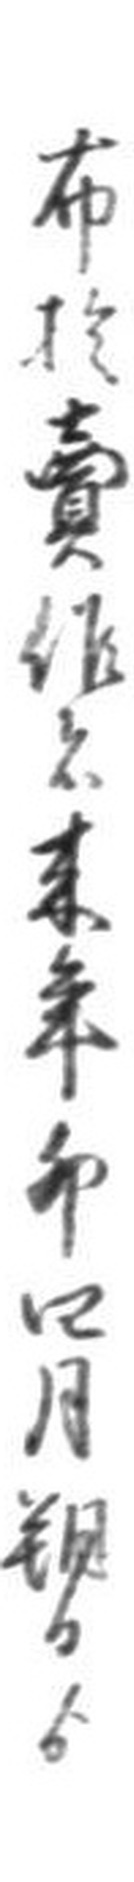布於賣作は来年卯四月朔日ゟ
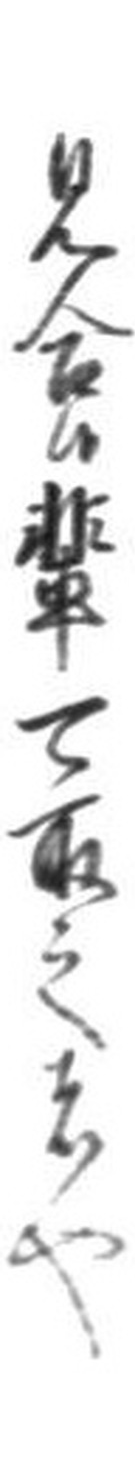見合候輩可取之者也
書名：家譜 三 忠昌公 従慶長八年到寛永六年
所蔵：福井県文書館 Fukui Prefectural Archives
